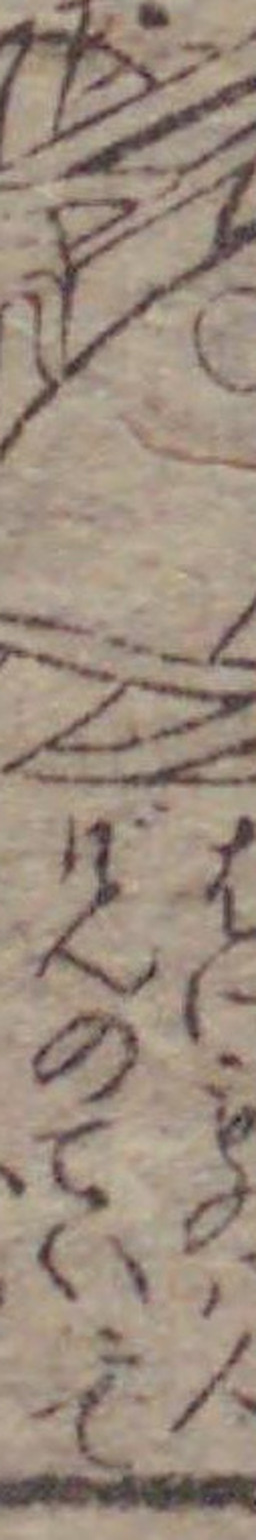げんのていにて
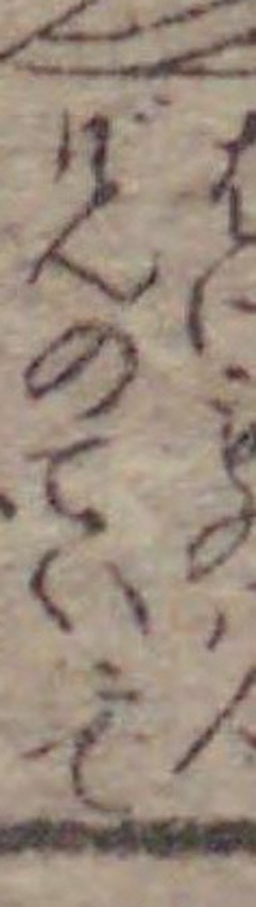げんのていにて
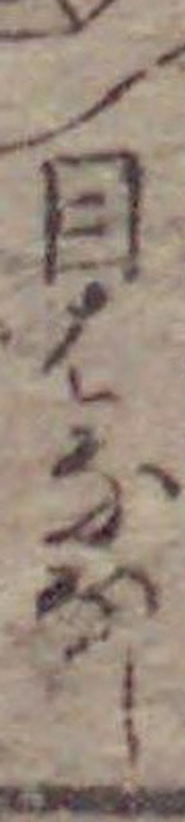目はななし
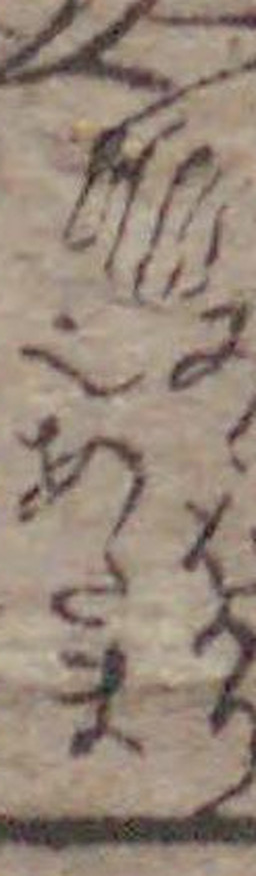也あたま
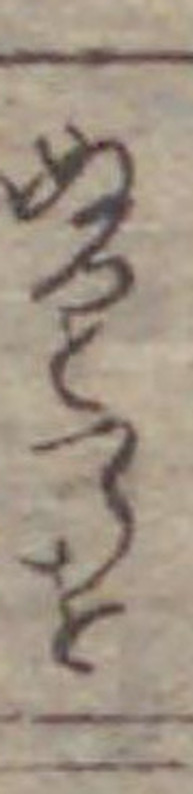ぬつとつらを
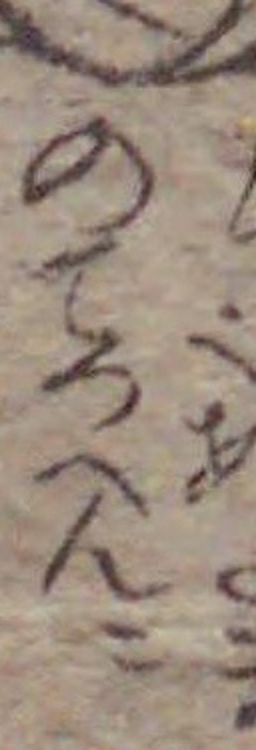のてつへんに
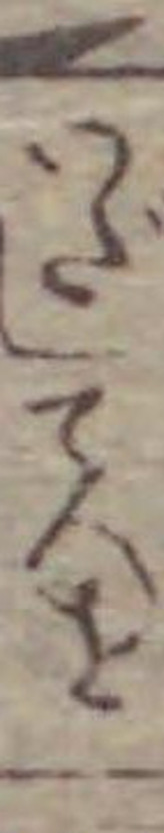いだして人を
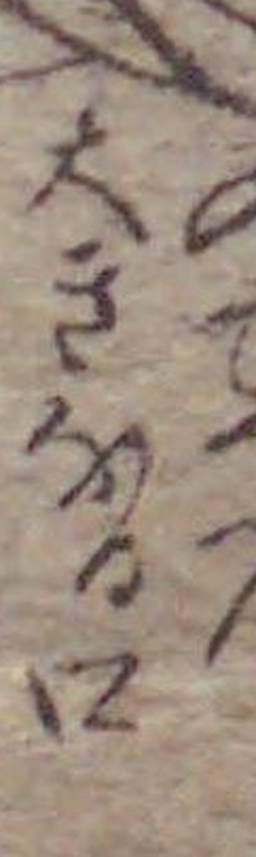大きなる口
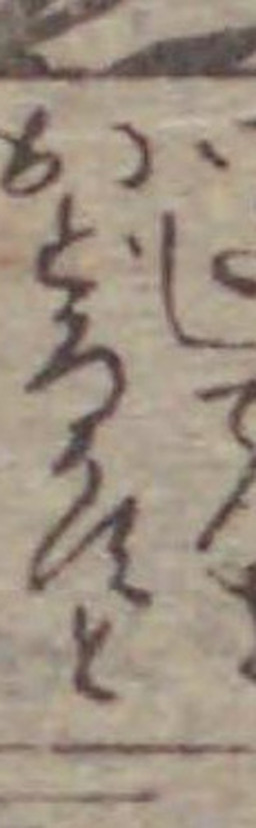おどろかすと
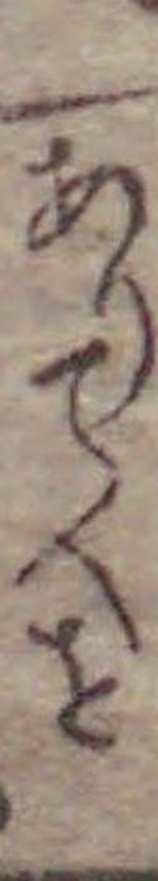ありて人を
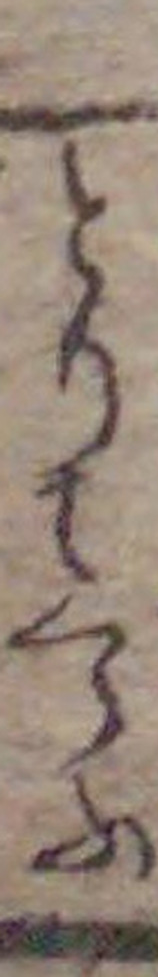とりてくらふ
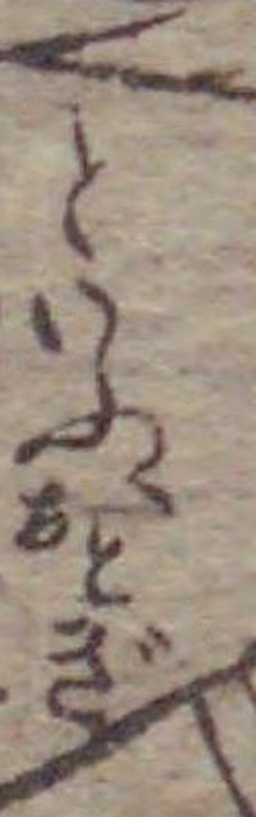といふおとぎ
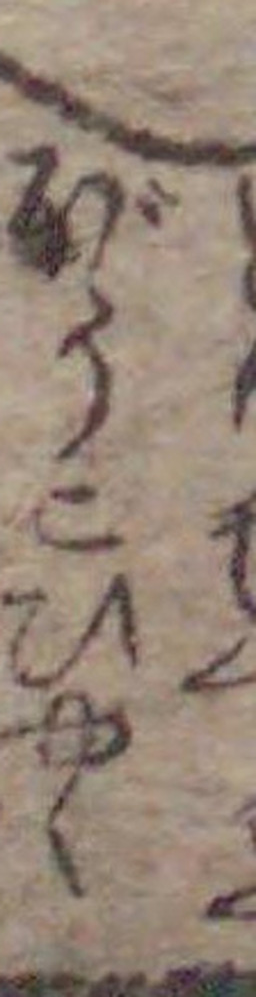うこひやく
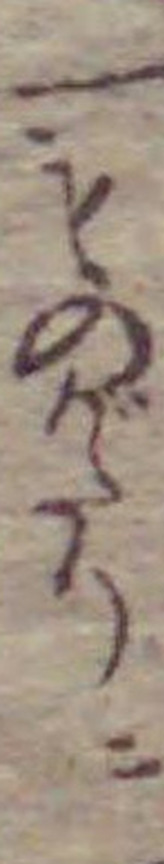ものがたりに
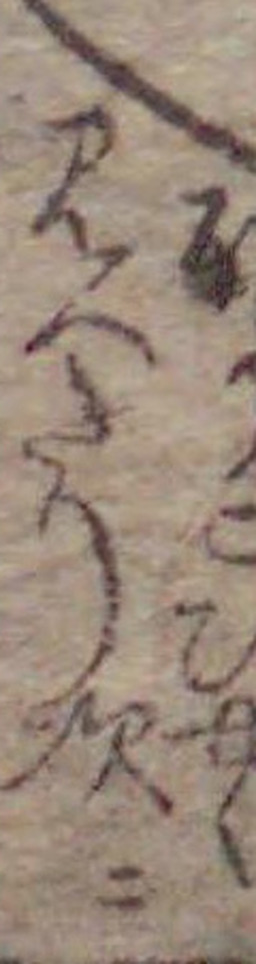見へたり次に
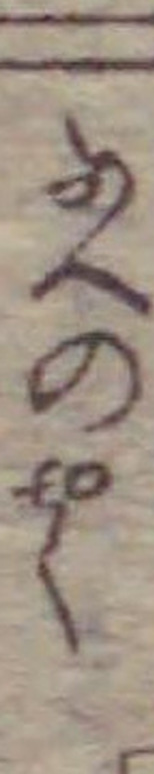ふへのやく
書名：妖怪仕内評判記 : 2巻
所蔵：国立国会図書館 National Diet Library, JAPAN
